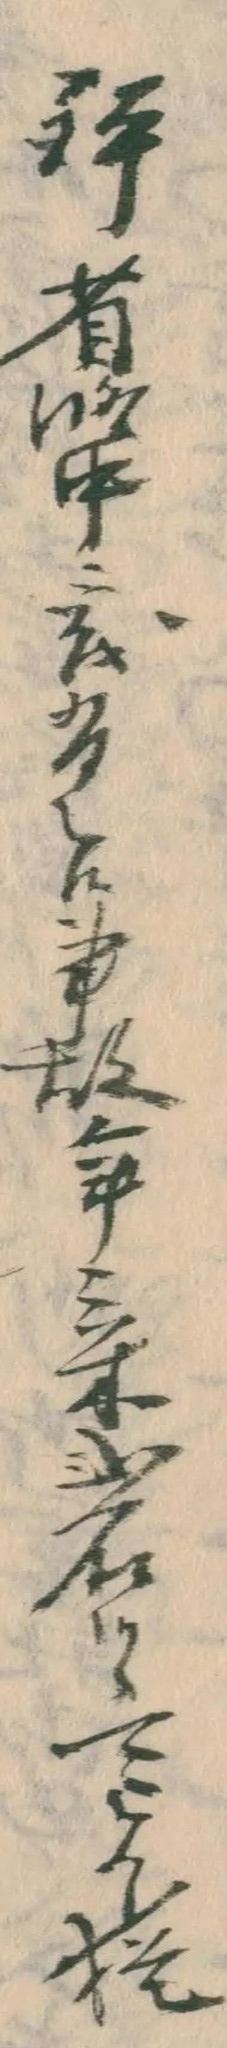評省略中ニも有之候事故年々米弐石ツゝ可被下候猶
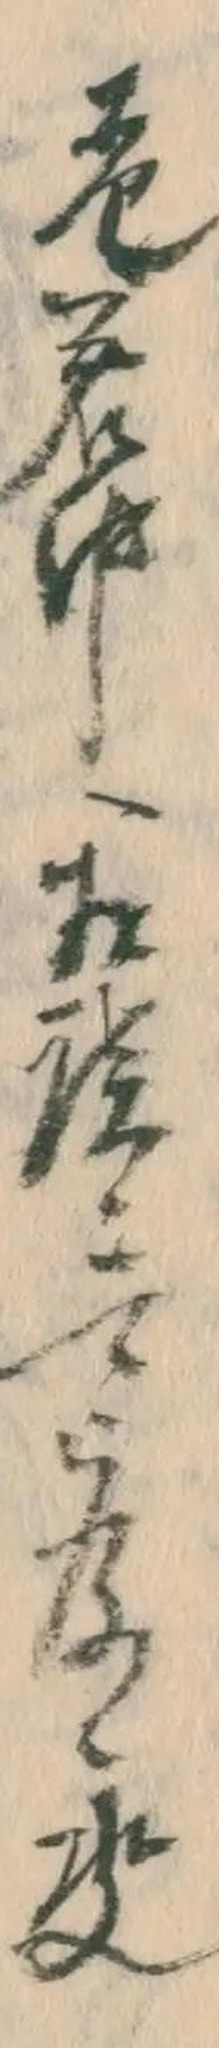老若中へ相談可被及候決
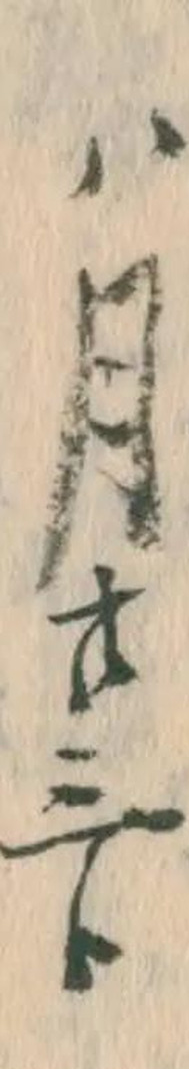八月廿三日
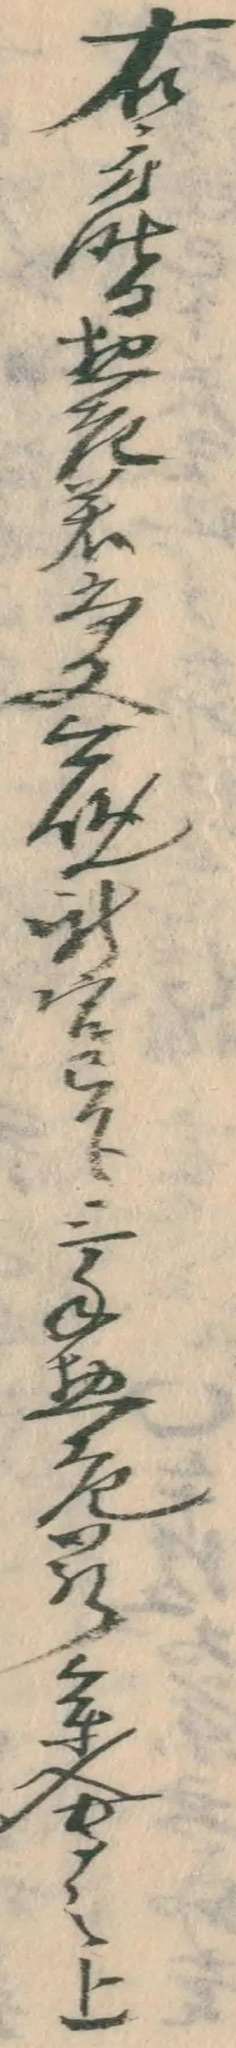右ニ付昨日惣老若尚又今晩新宮已下三手惣老若参會之上
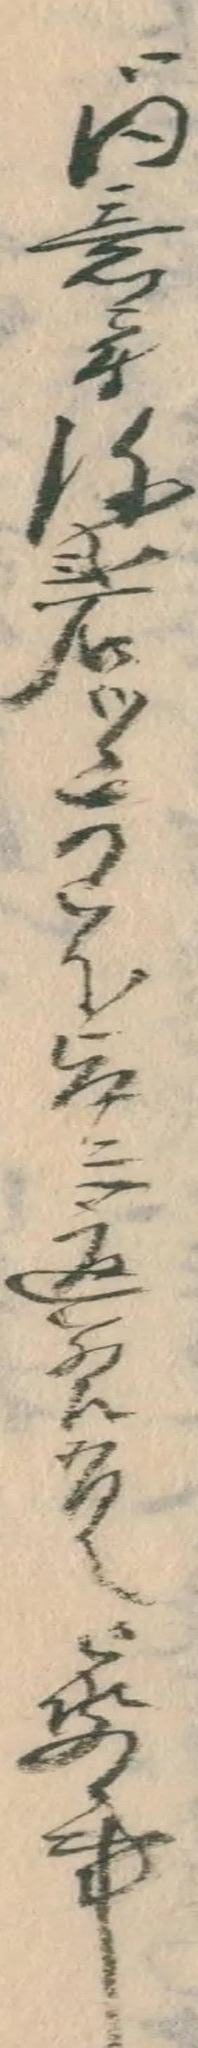御内意ニ付致弐石ツヽ可被下旨ニ而返答有之被決候事
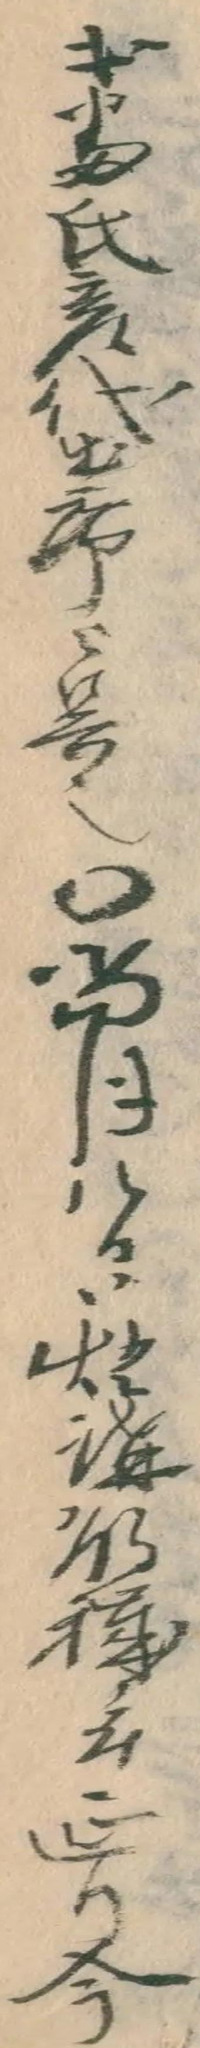出番氏彦代出席被呉也○當月八日ハ燈講触穢ニ而延引今

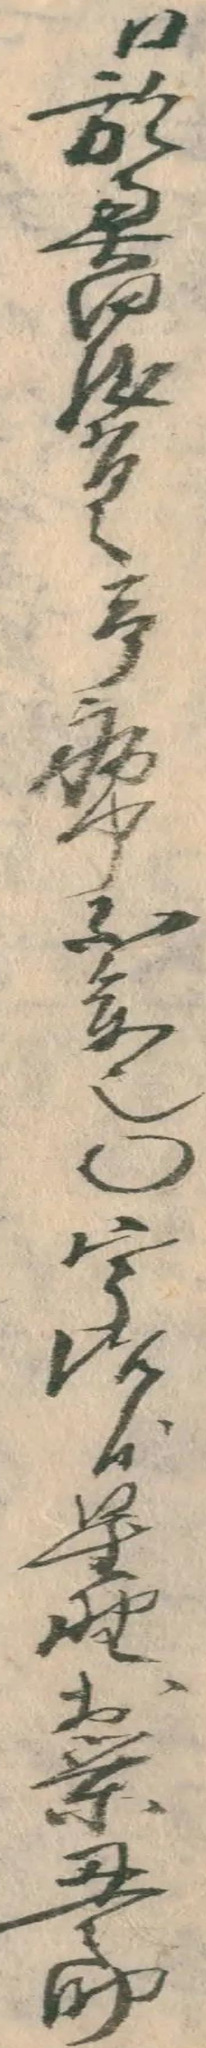日於奥田屋有之予病中不参也○宇治ゟ星野お栄丑之助
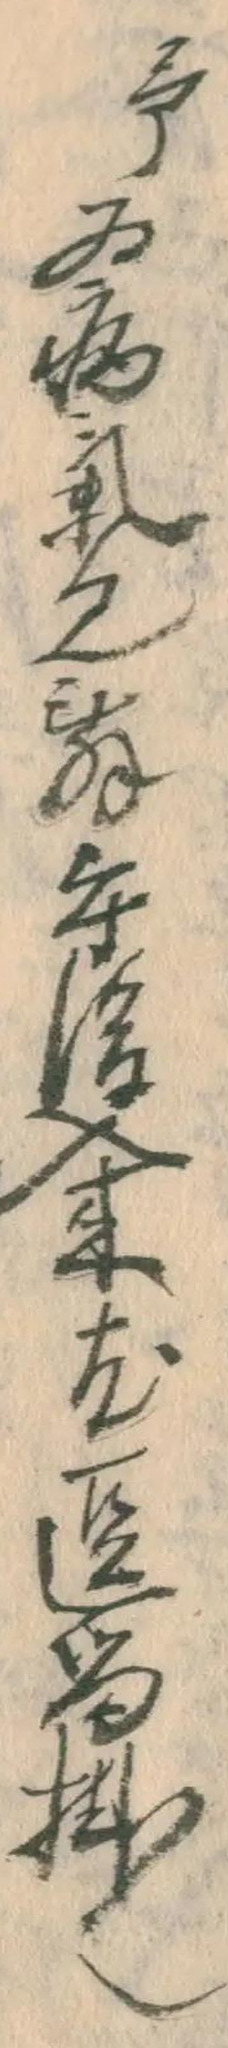予為病気見舞午後入来尤逗留掛也
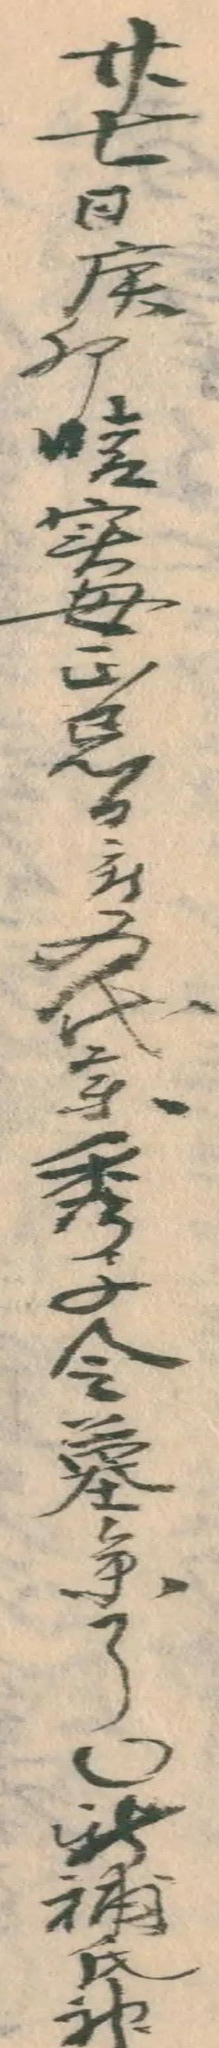廿七日庚卯晴実母正忌日ニ付為代参秀子令墓参了〇新補氏神
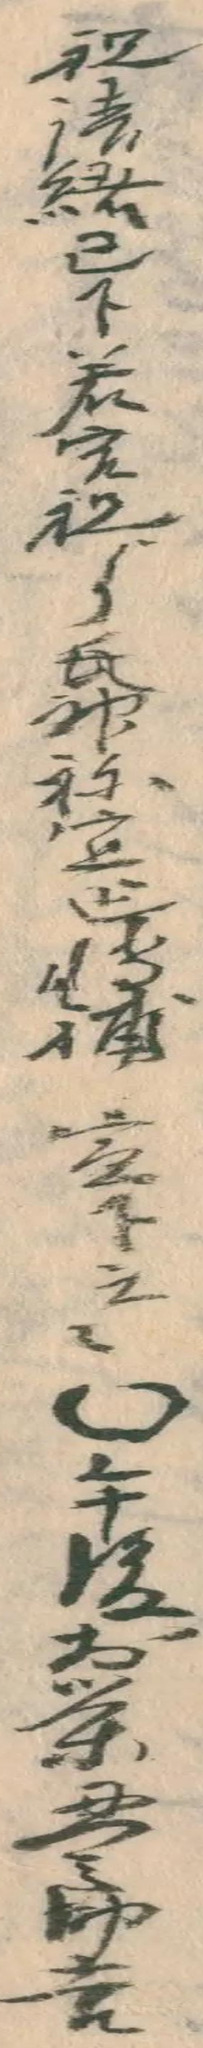祝清緒已下若宮祝より氏神称宜迄転補宣下云々〇午後お栄丑之助吉
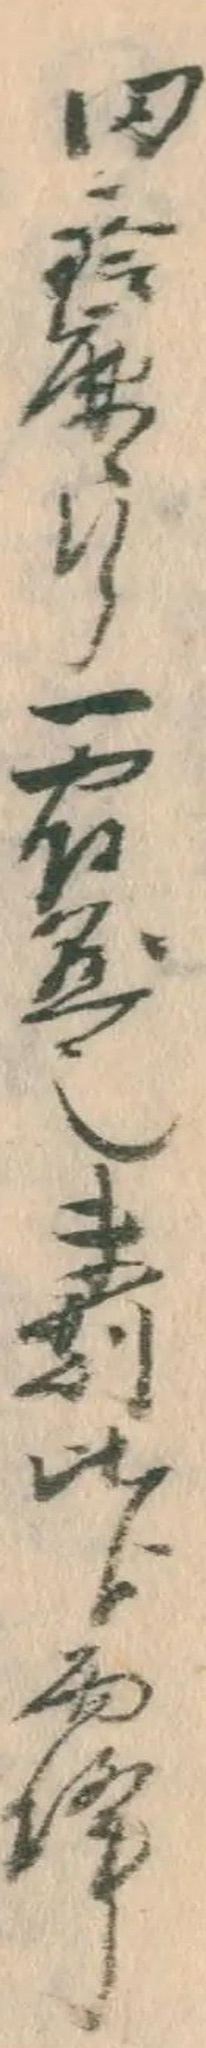田鈴鹿へ引一宿懸也未刻頃ゟ雨降
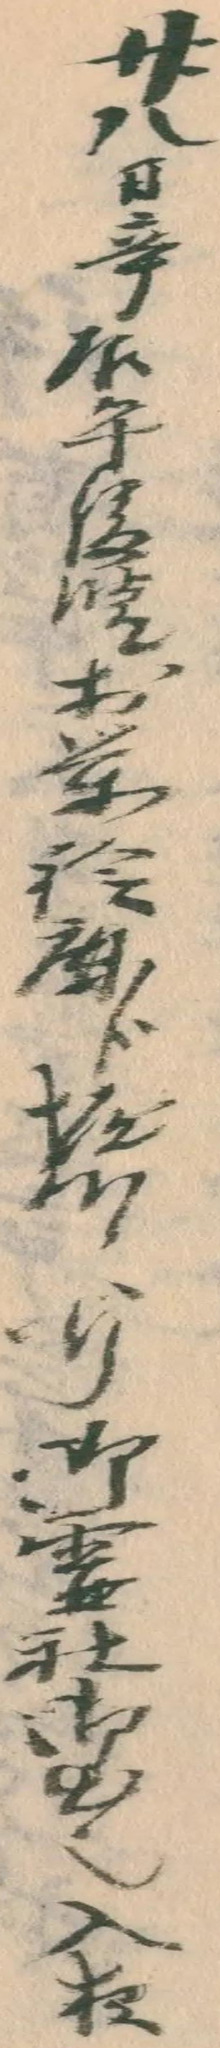廿八日辛辰午後晴お栄鈴鹿ゟ堀川へ行御霊社御出也入夜
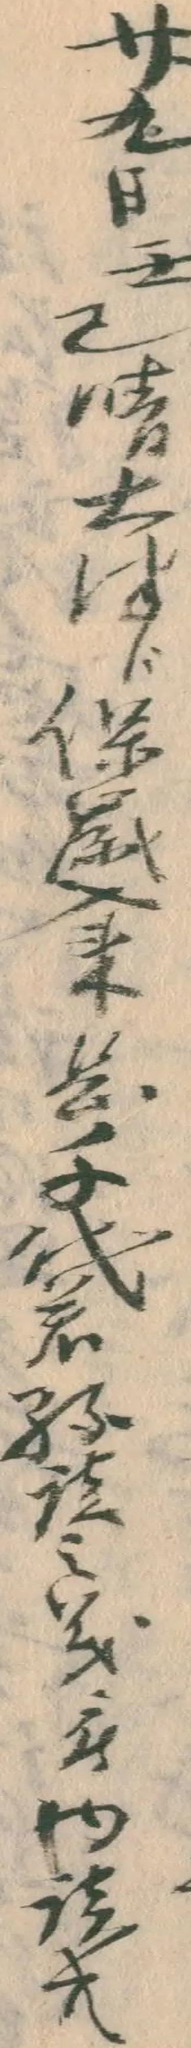廿九日壬巳晴大津ゟ保歳入来息千代若縁談ニ付内談共
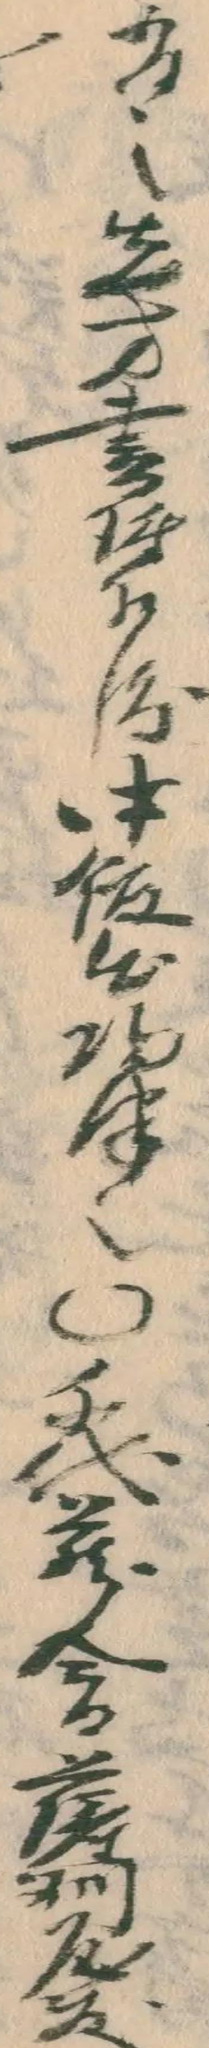有之先方書附相渡中飯出帰津也〇千代蔵今日薩州屋敷
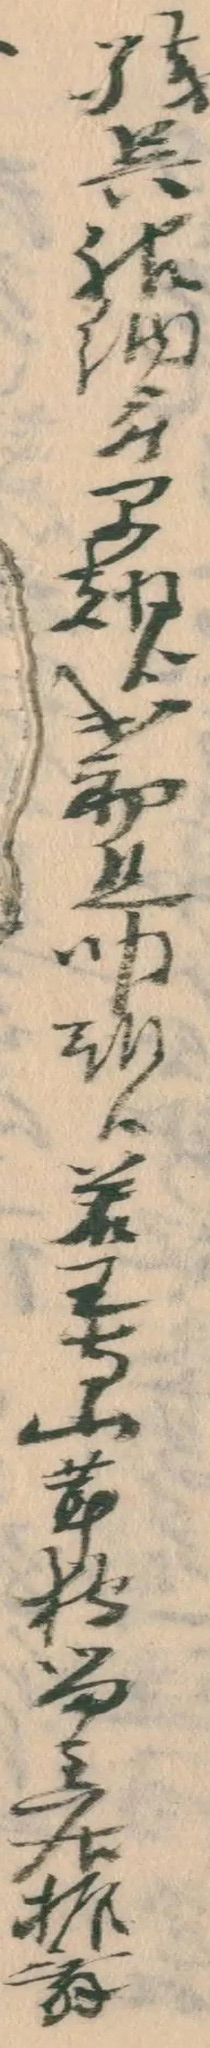残呉服納ニ付早朝ゟ出勤且明朔日若王寺山帯持留主居振舞
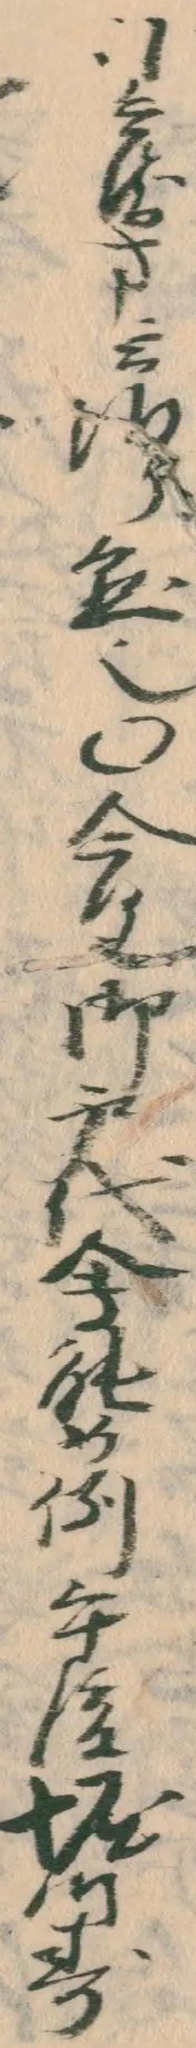小兵衛方ニ而泊り懸也○今日御戸代會能如例午後堀川壽
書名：賀茂社記録. 第70冊
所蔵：国立国会図書館 National Diet Library, JAPAN
